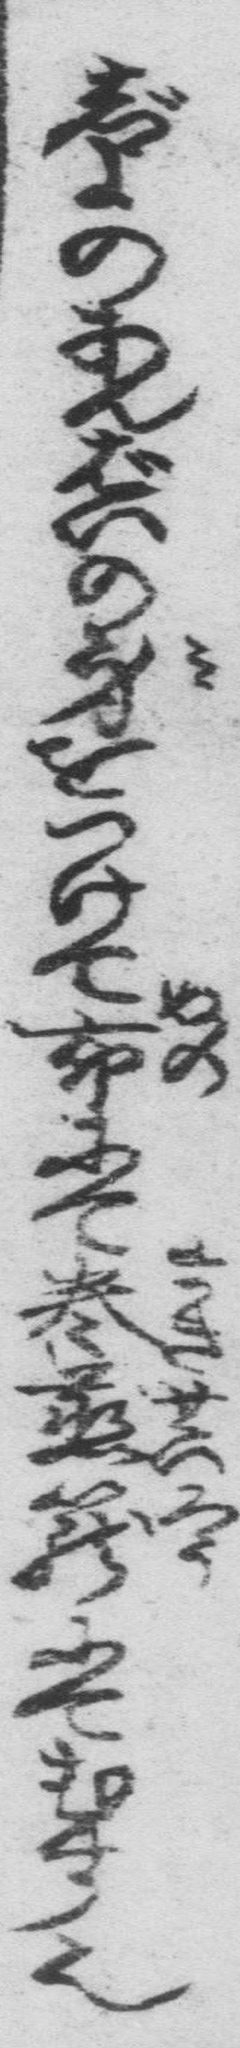じよのあんばいの身をつけて布にて巻蒸籠にてむす也
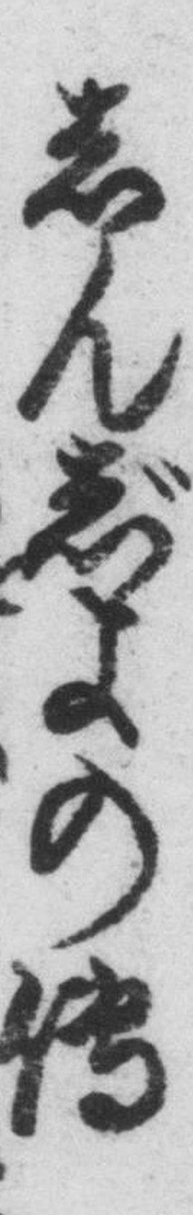しんじよの傳
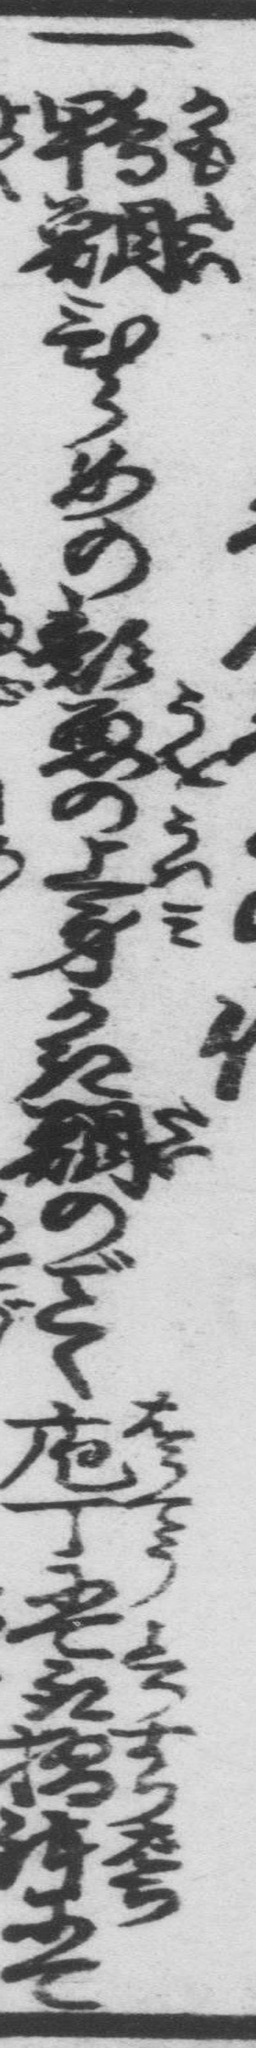一鴨隊ひらめの類魚の上身かた鯛のごとく庖丁にて能取摺鉢にて
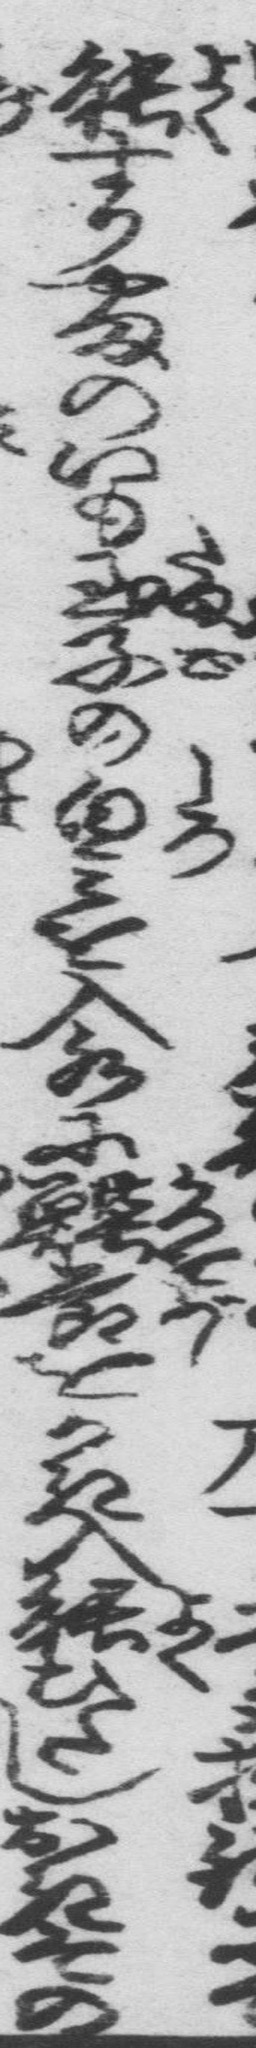能すりやまのいも玉子の白ミを入水に鰹節をかき入能ひたし
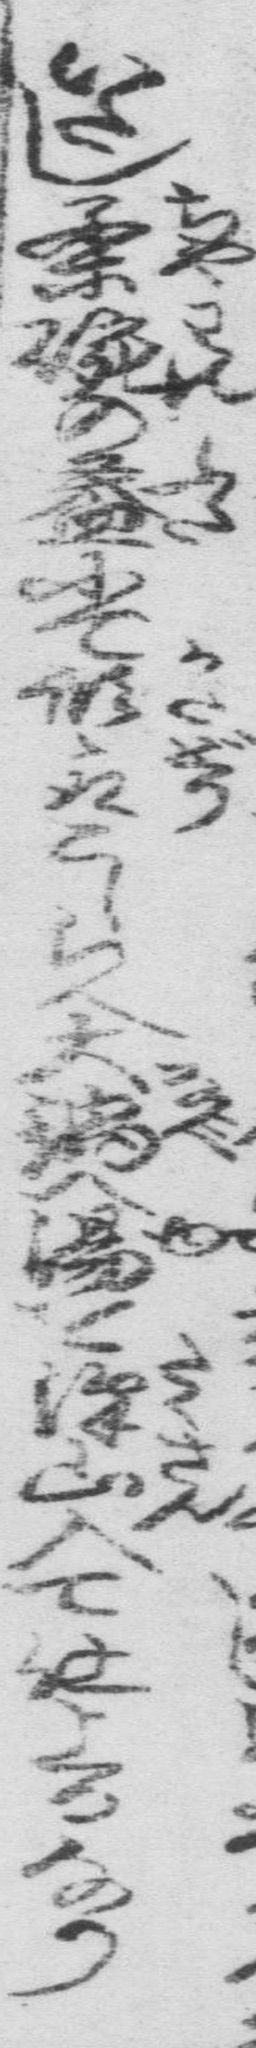いたし茶碗の蓋にて形取こしらへ大鍋湯を沢山入て仕上るなり
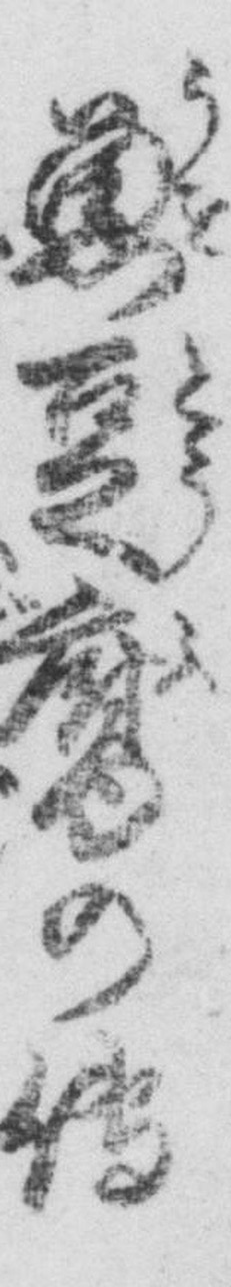魚豆腐の傳
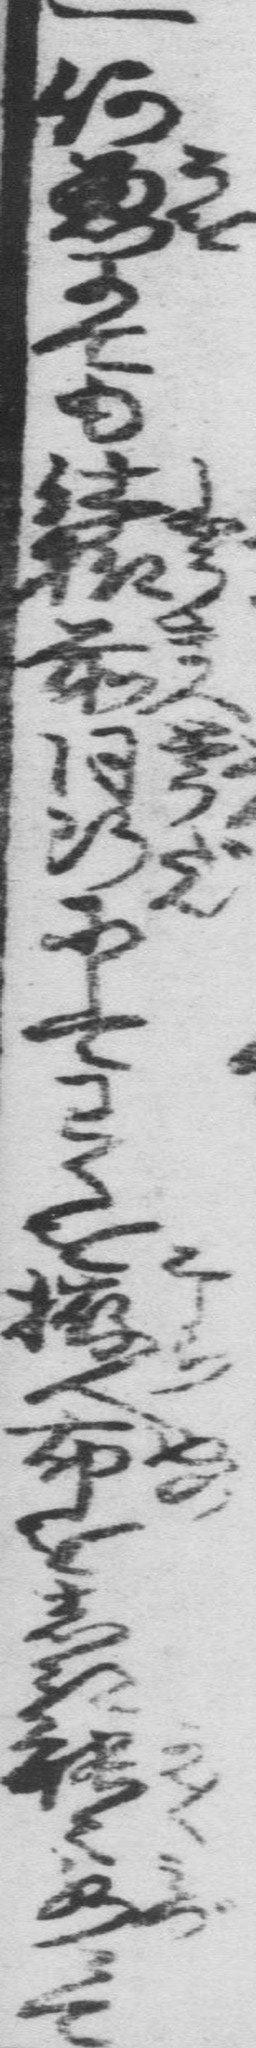一何魚にても仕様前同段にしてわくを拵へ布をしき水ニて
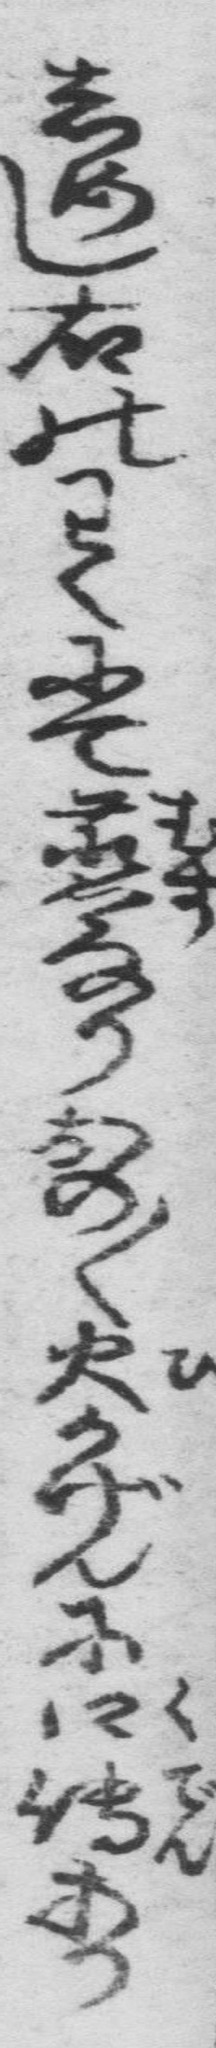しめし右のわくにて蒸なりおの〳〵火かげんに口傳あり
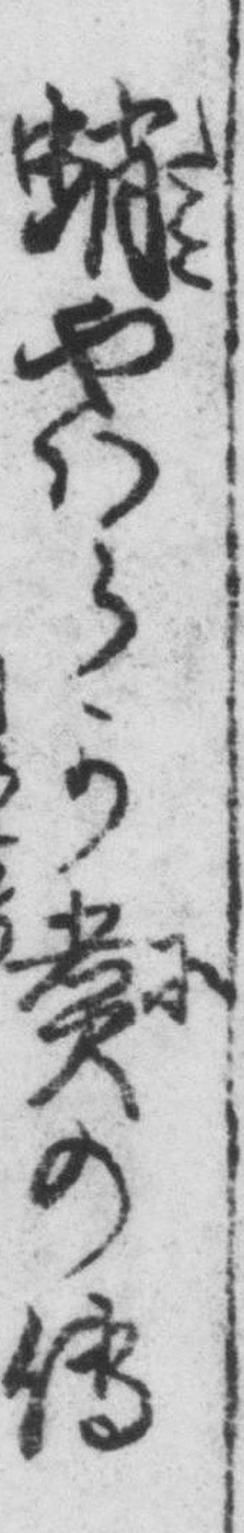蛸やハらか煮の傳
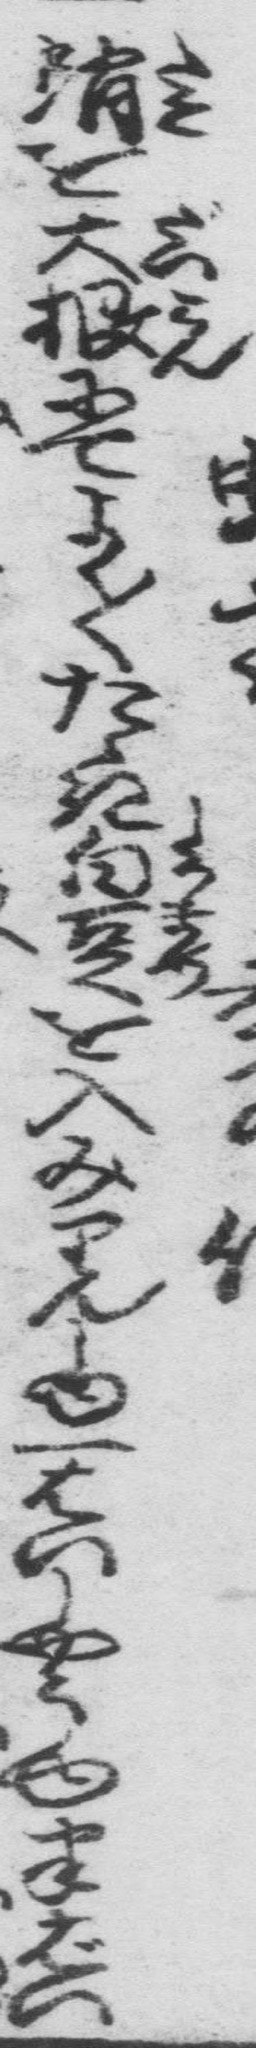一蛸を大根にてよく〳〵たゝき白豆を入みりんしゆ一はいしやうゆ
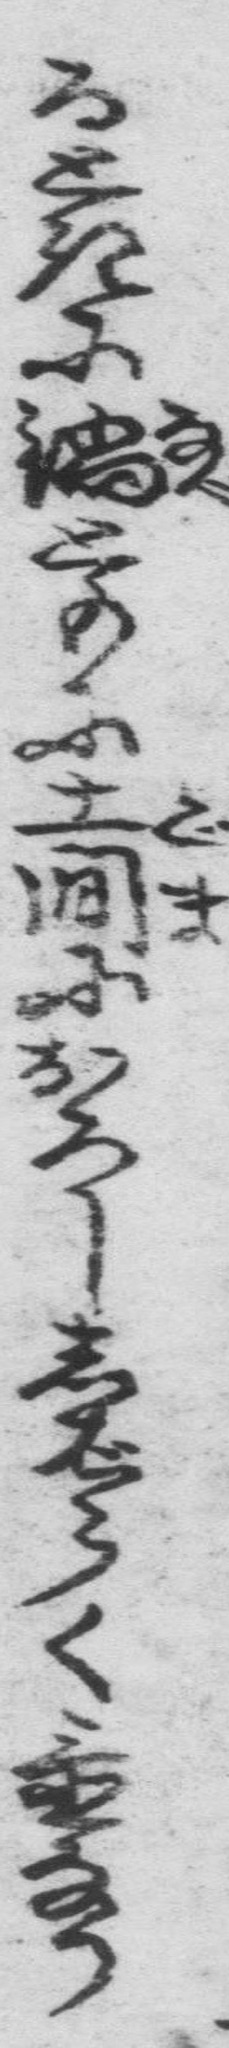るときに鍋に土間におろししばらく置なり
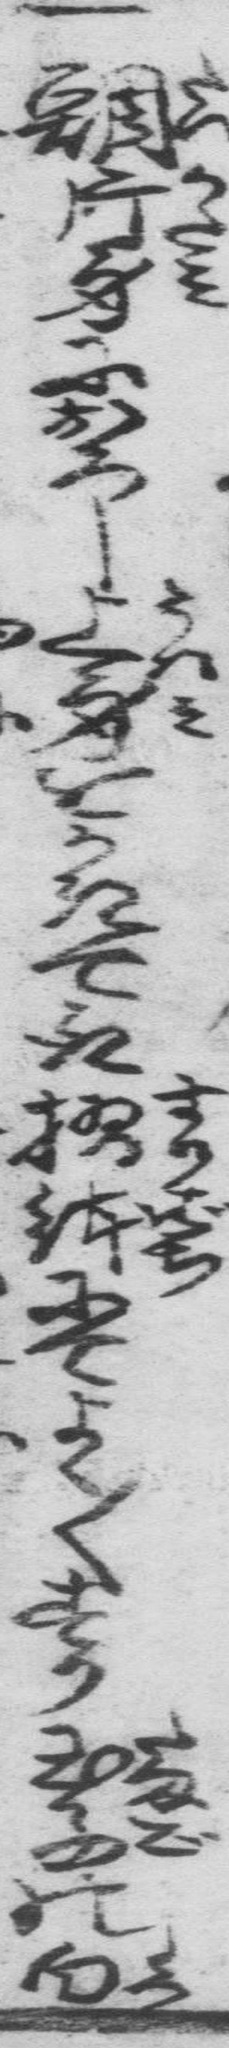一鯛片身におろし上身をかきて取摺鉢にてよく〳〵すり玉子の白
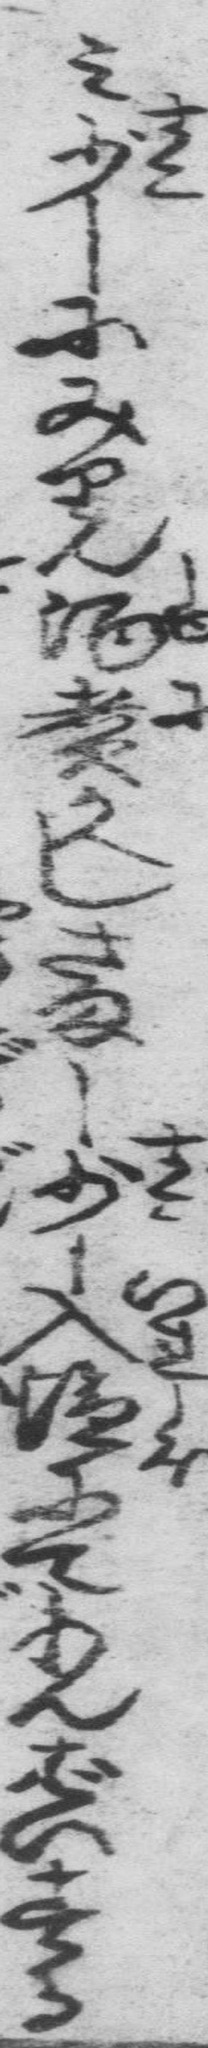ミ少しにみりん酒煮かへしさまし少し入塩にてあんばいする
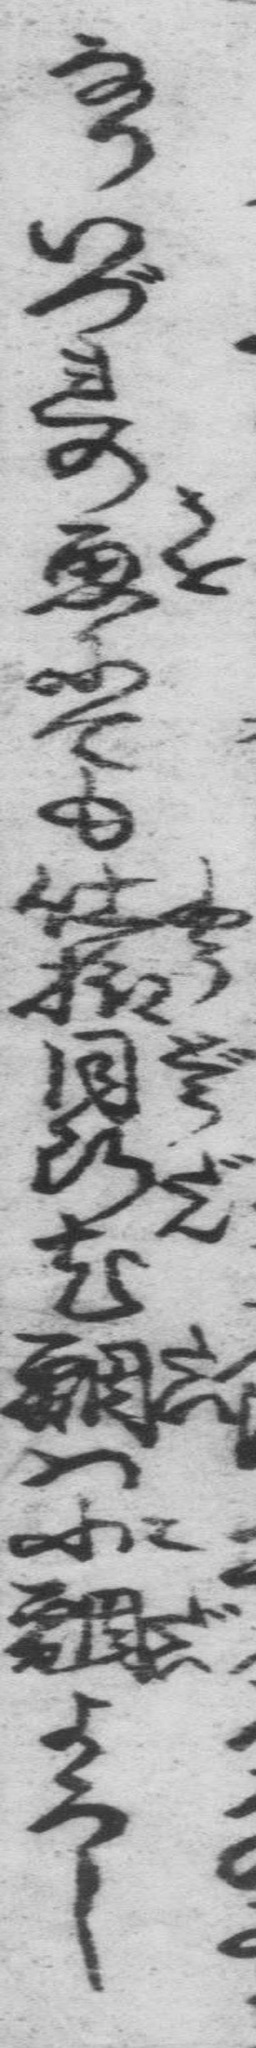なりいづれの魚にても仕様同段尤鯛ハ小鯛よろし
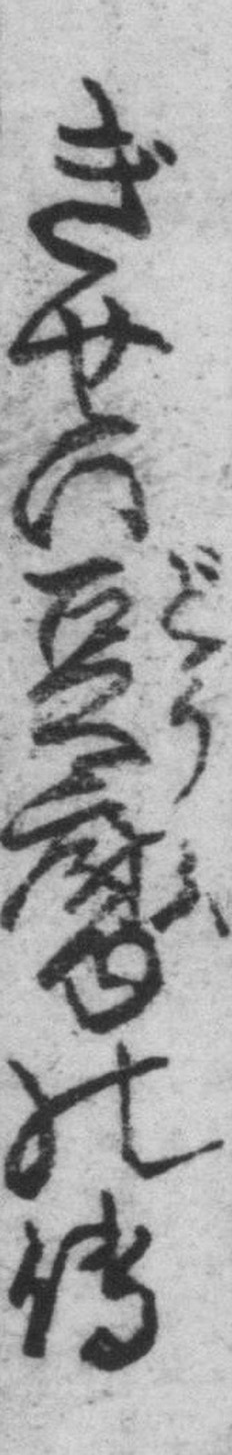ぎせい豆腐の傳

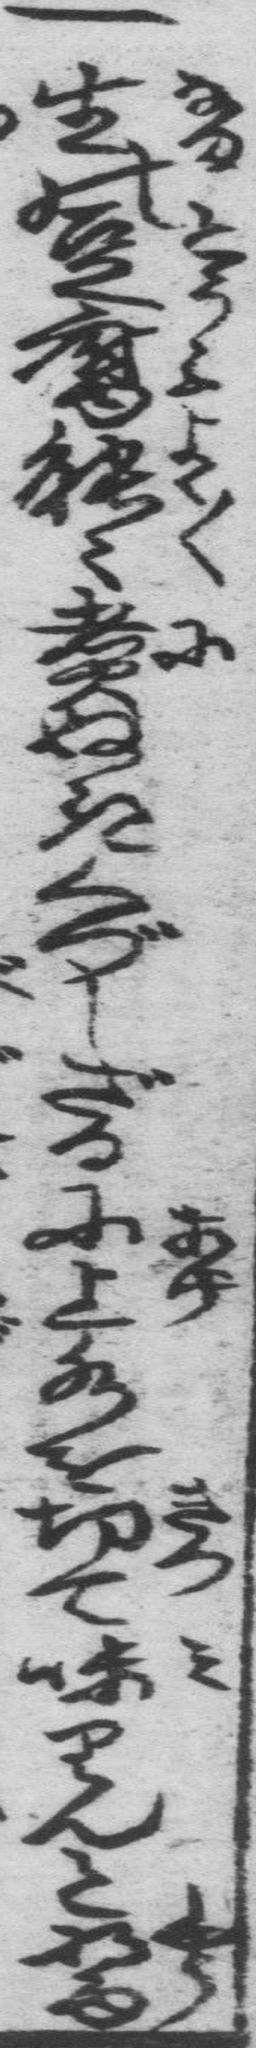一生の豆腐能々煮ぬきくづしざるに上水を切て味りんと醤
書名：即席庖丁
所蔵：大阪府立大学学術情報センター 国文学研究資料館
